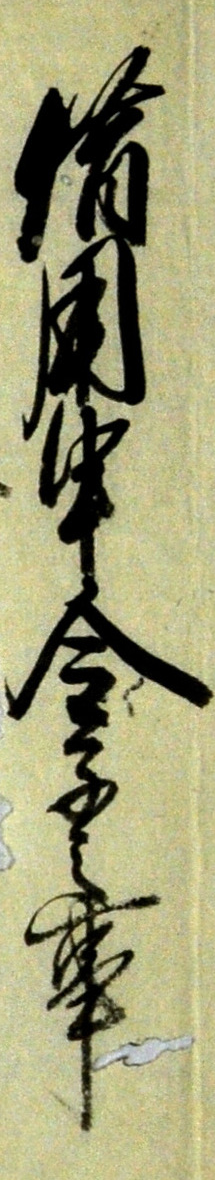借用申金子之事
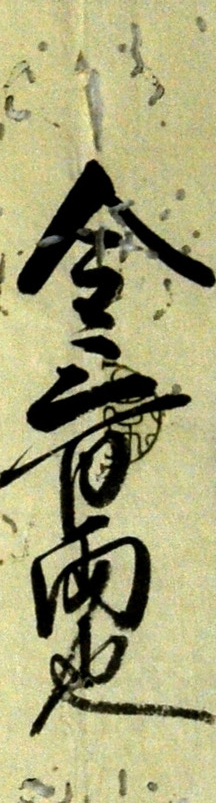金三百両也
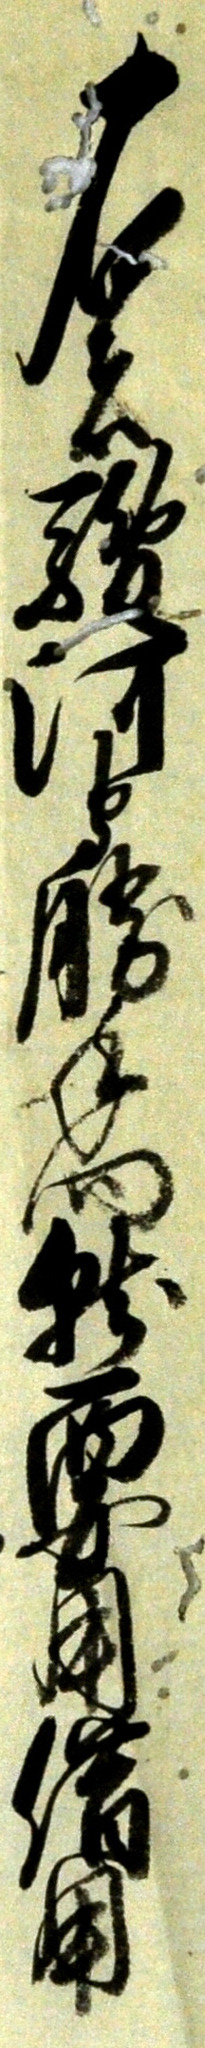右者駿河守勝手向就要用借用
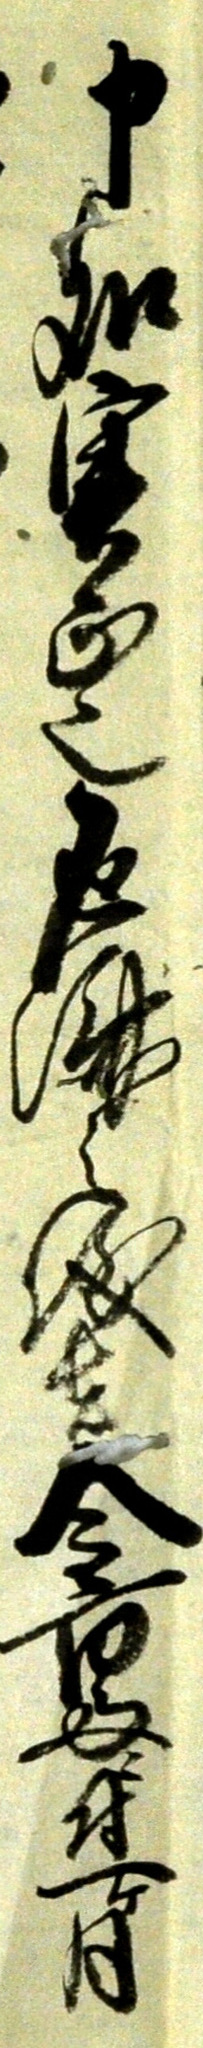申処実正也返済之儀者金百両ニ付一ヶ月
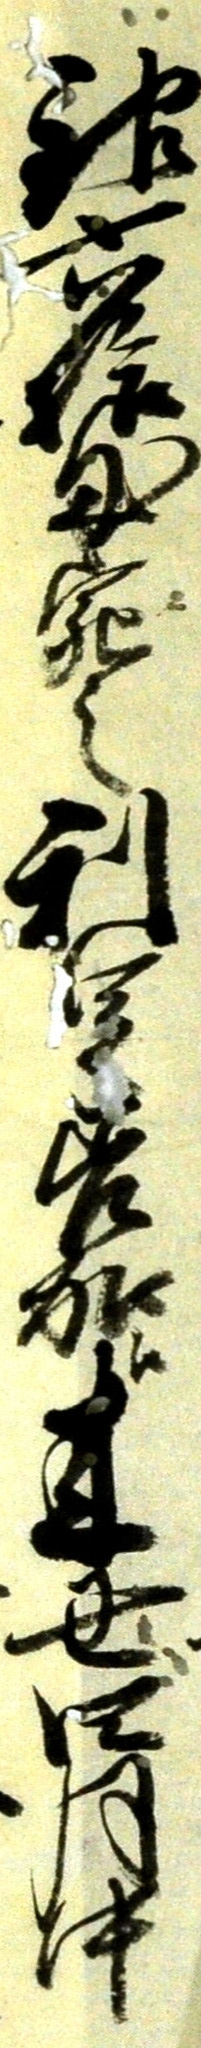銀六拾匁宛之利足差加江来丑四月中
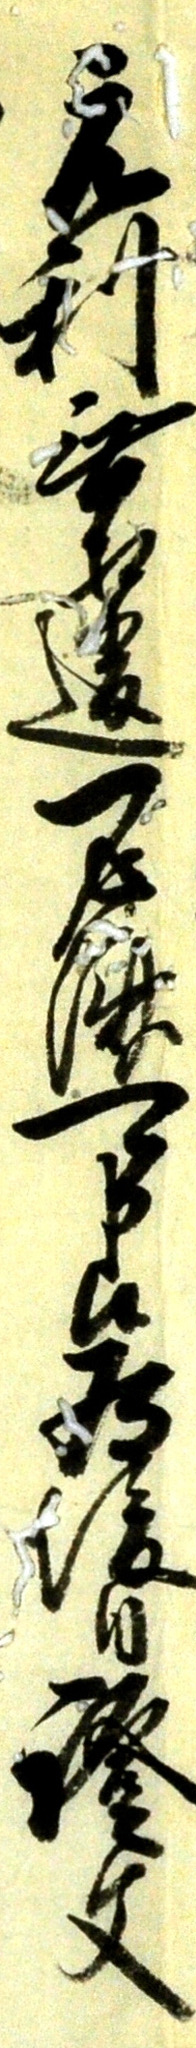元利無相違返済可申候為後日証文
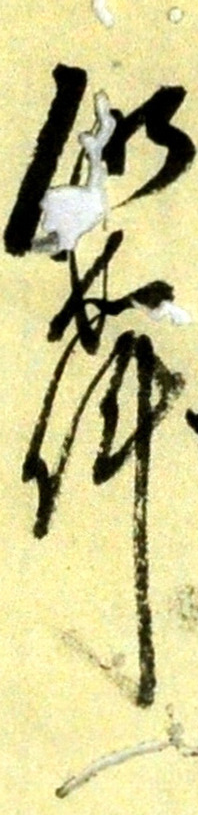仍如件
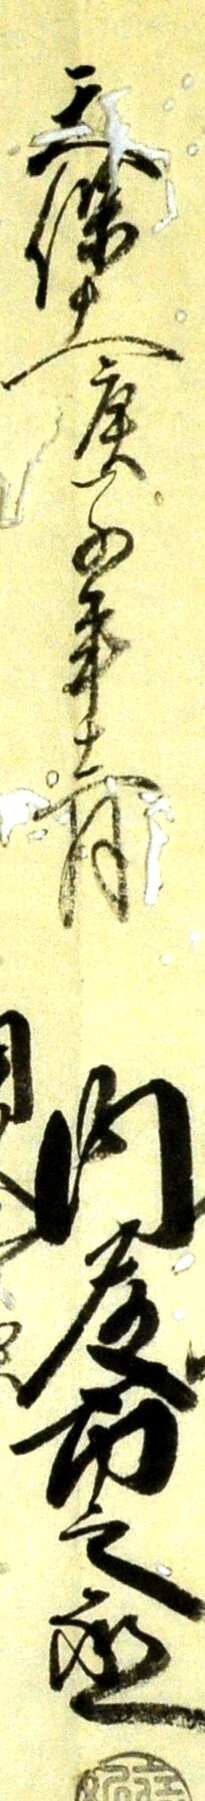天保十一庚子年十二月内藤市之丞
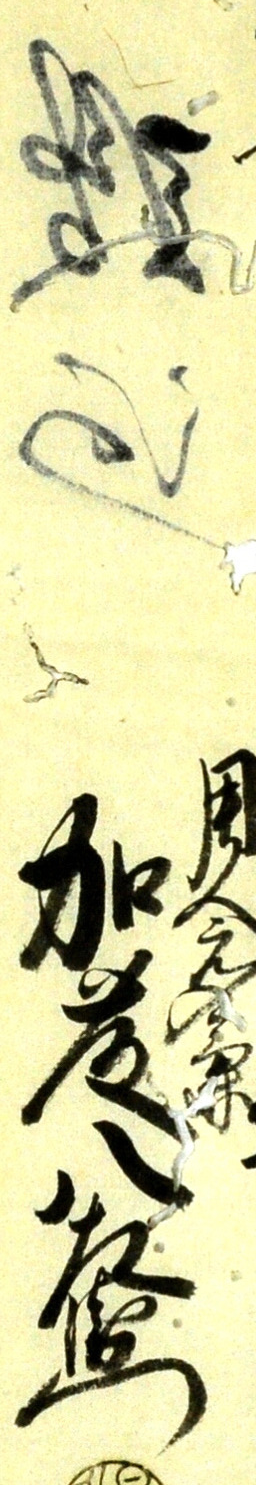加藤八左衛門
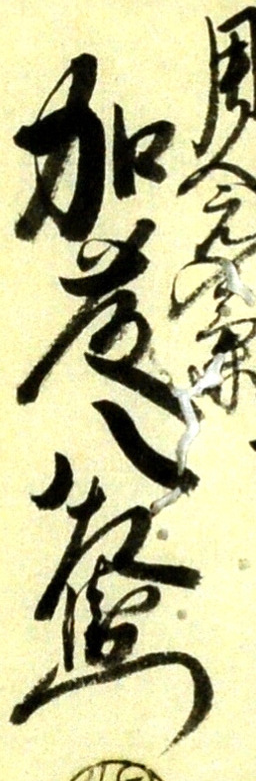加藤八左衛門
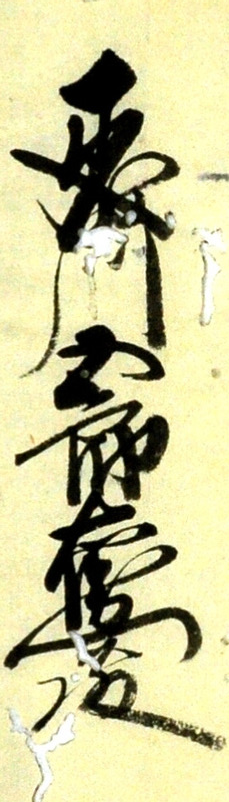森川五郎右衛門殿
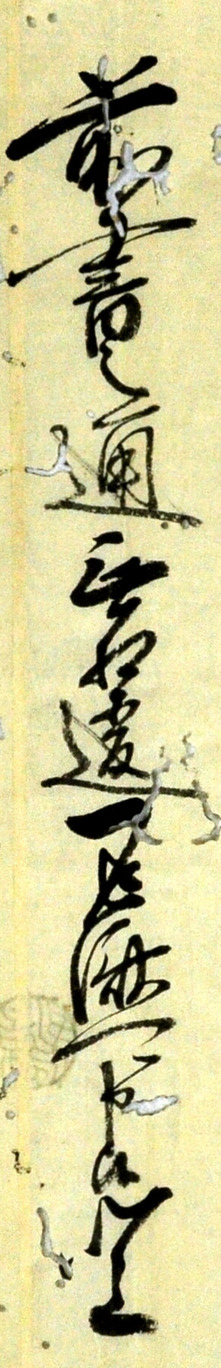前書之通無相違返済可申候以上
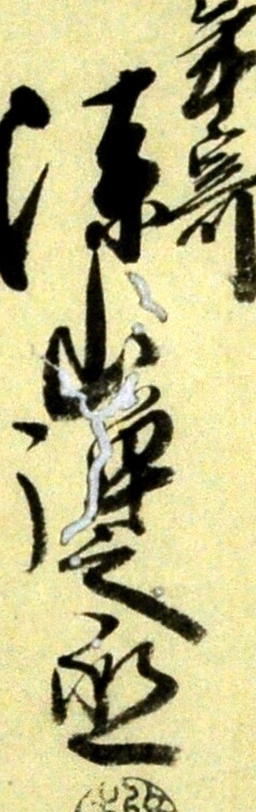漆山騨之丞

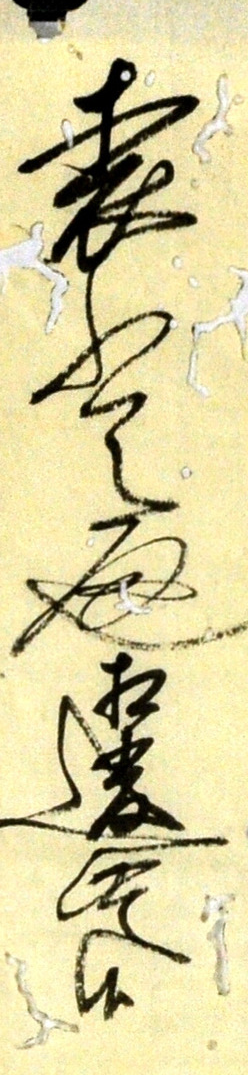表書之通相違無之候
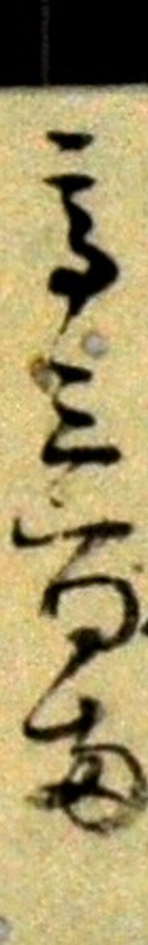高三百両
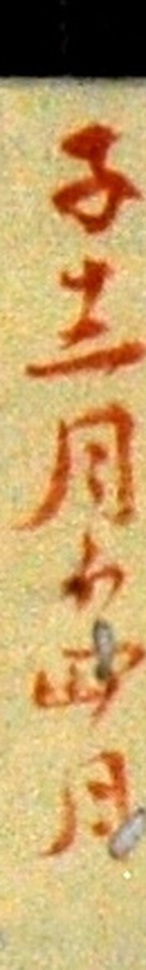子十二月ゟ四月
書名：借用申金子之事
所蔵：伊那市立高遠町図書館・合同会社AMANE
